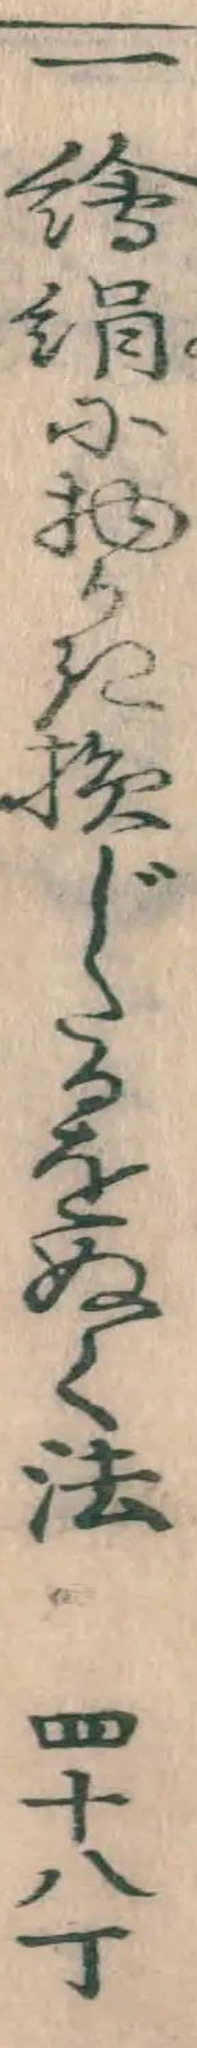一絵絹に物かき損じたるをぬく法四十八丁
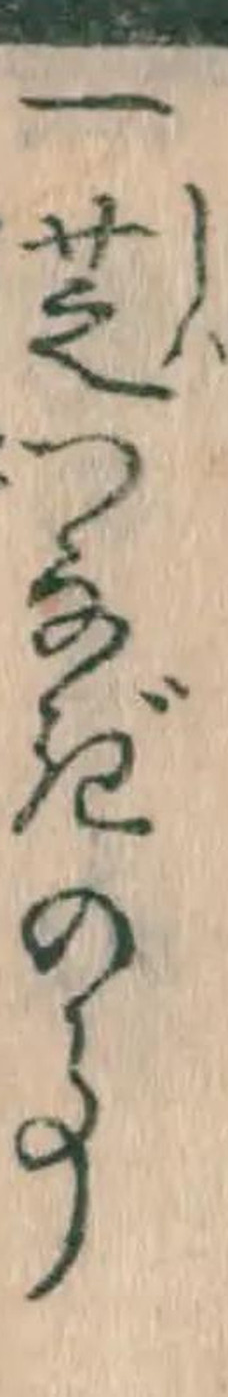一芝つなぎの事
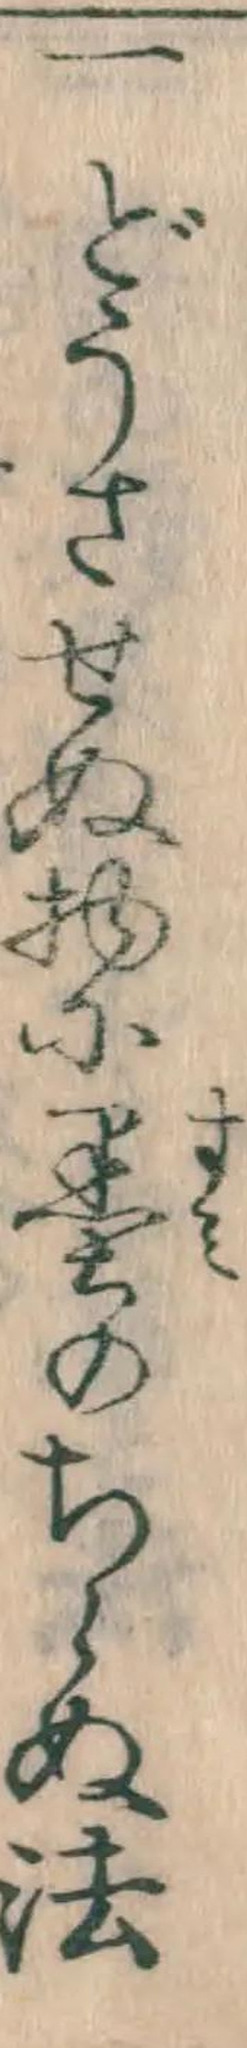一どうさせぬ物に墨のちらぬ法
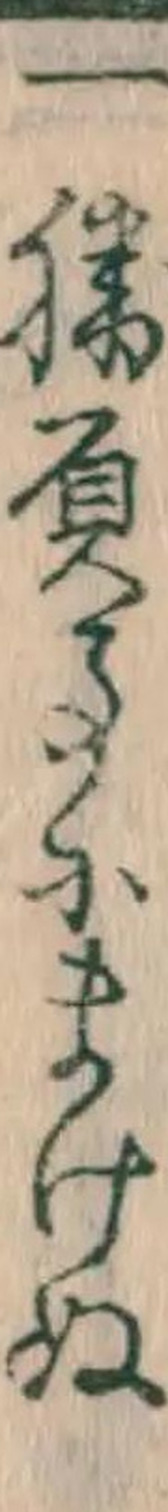一勝負事にまけぬ
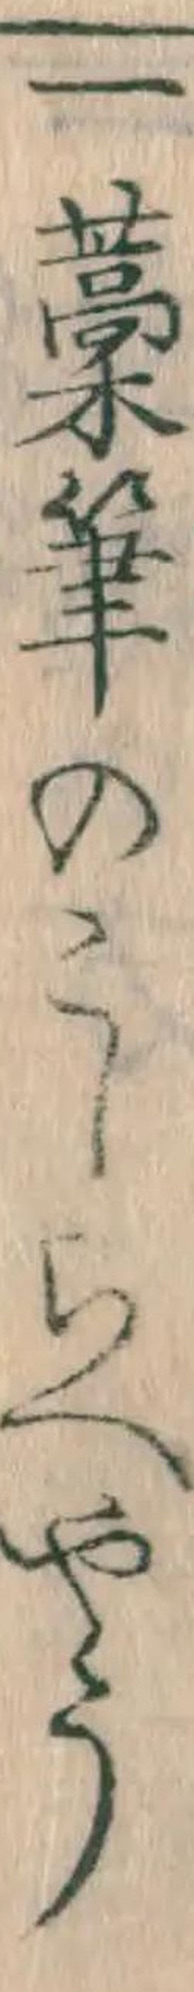一藁筆のこしらへやう
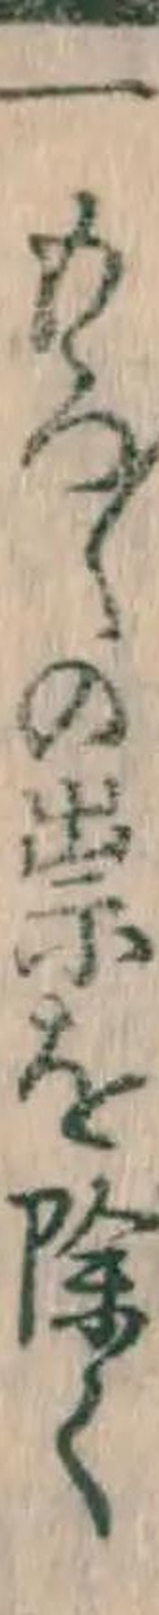一もろ〳〵の祟を除く
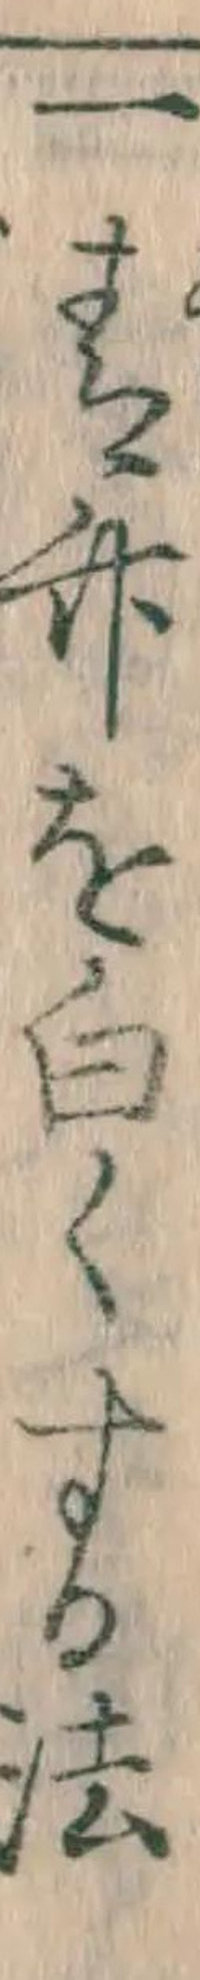一青竹を白くする法
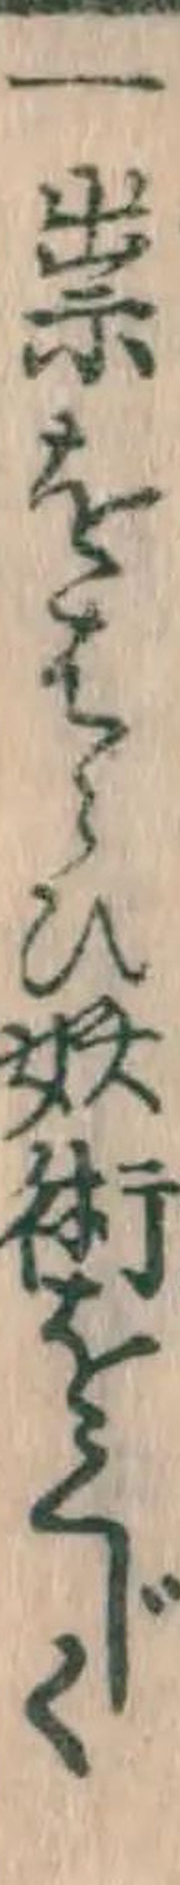一祟をはらひ妖術をくじく
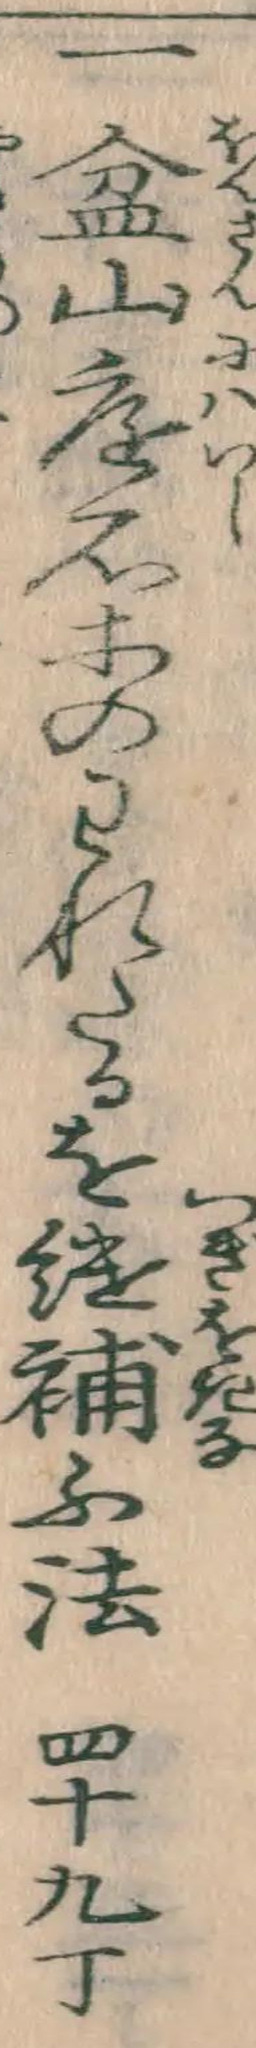一盆山庭石等のわれたるを継補ふ法四十九丁
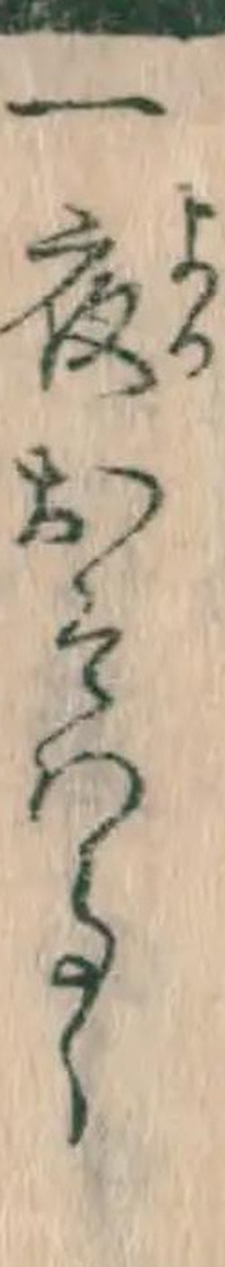一夜おそはるゝ
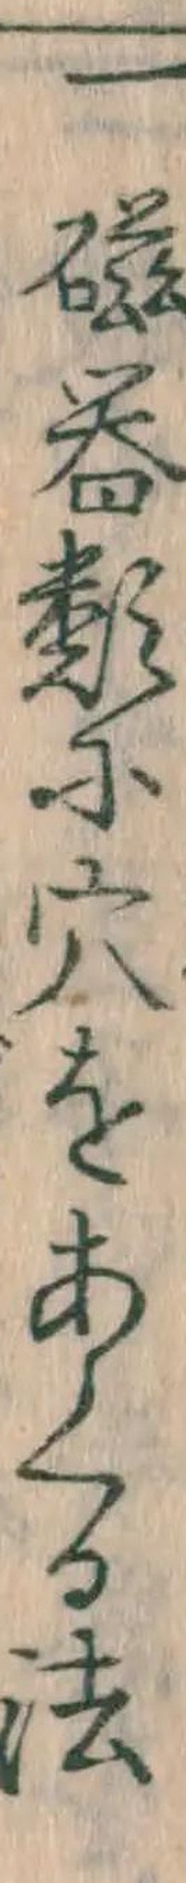一磁器類に穴をあくる法
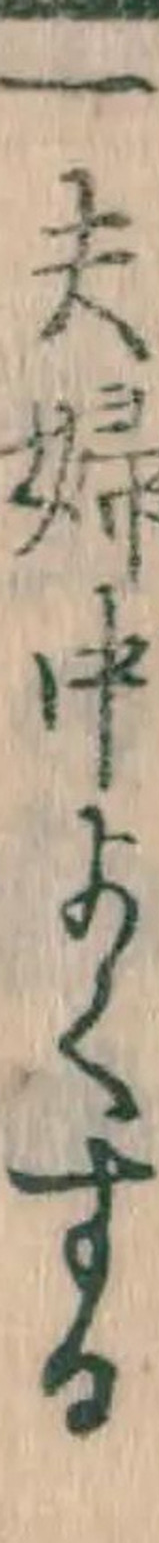一夫婦中よくする
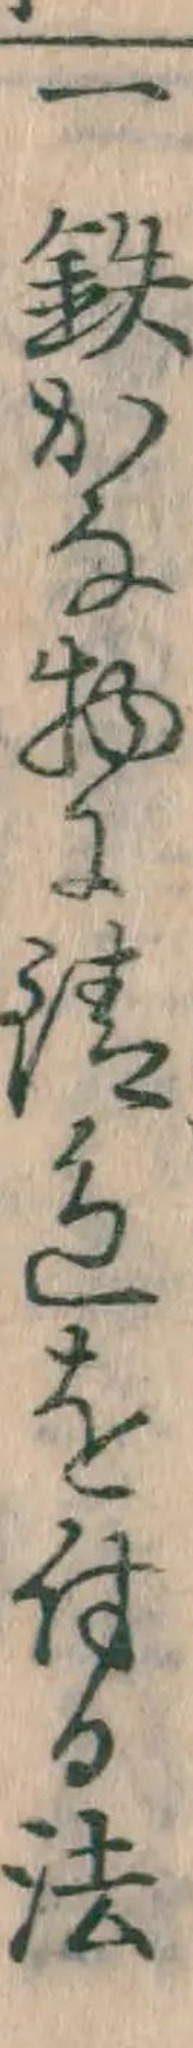一鉄かな物に錆色を付る法
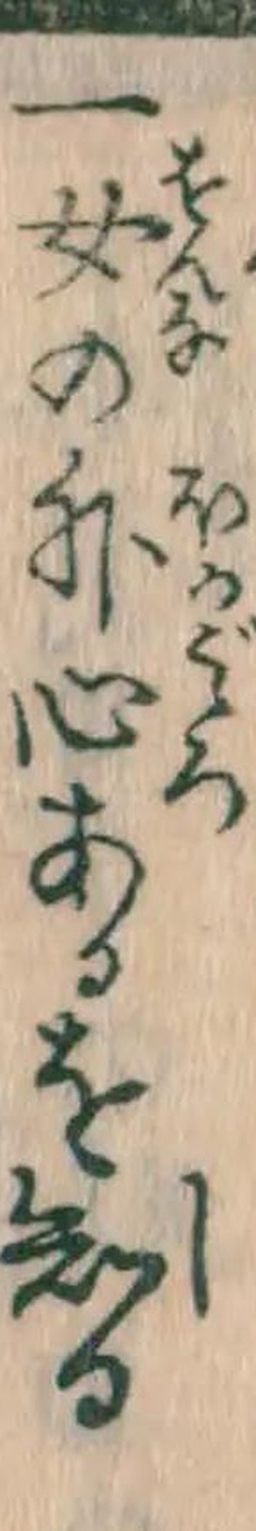一女の外心あるを知る
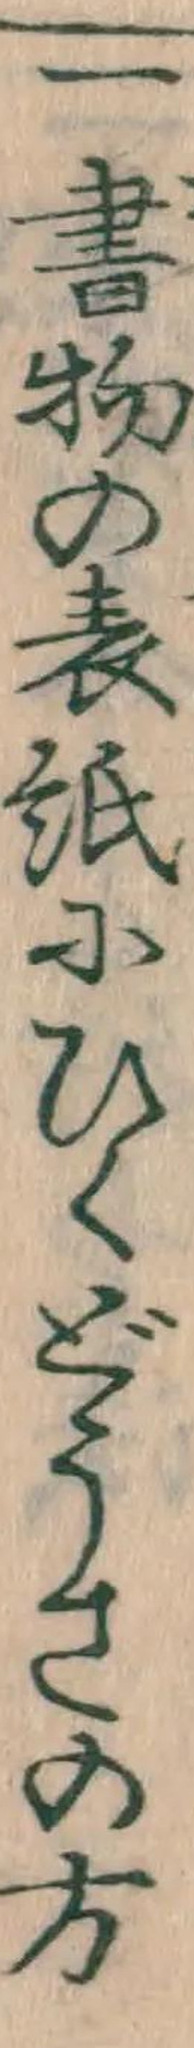一書物の表紙にひくどうさの方
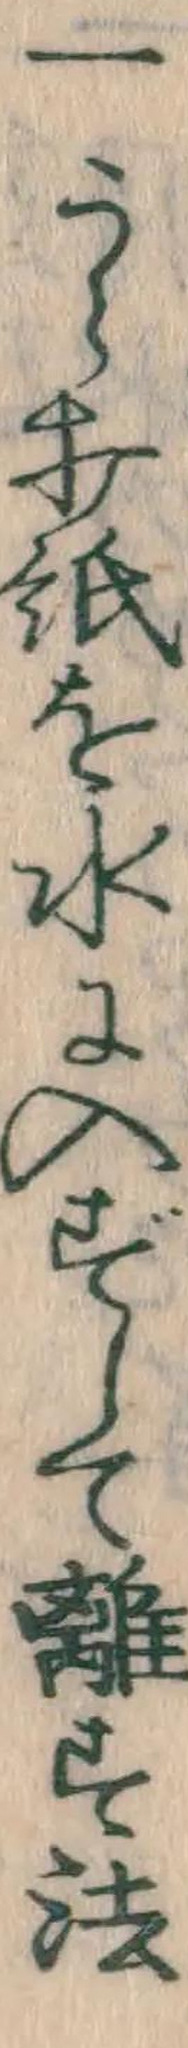一うら打紙を水に入ずして離す法
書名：広益秘事大全 3巻. [1]
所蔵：国立国会図書館 National Diet Library, JAPAN
